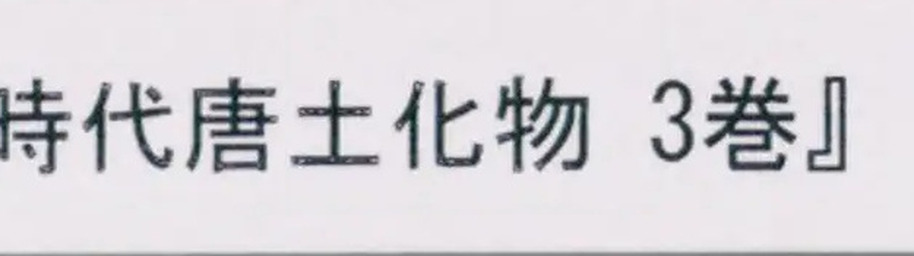大時代唐土化物
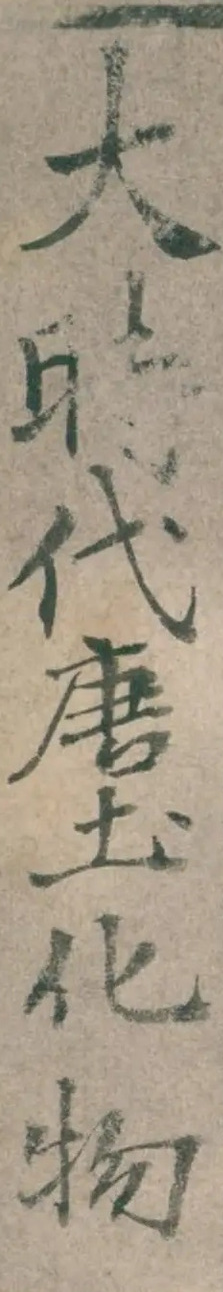大時代唐土化物

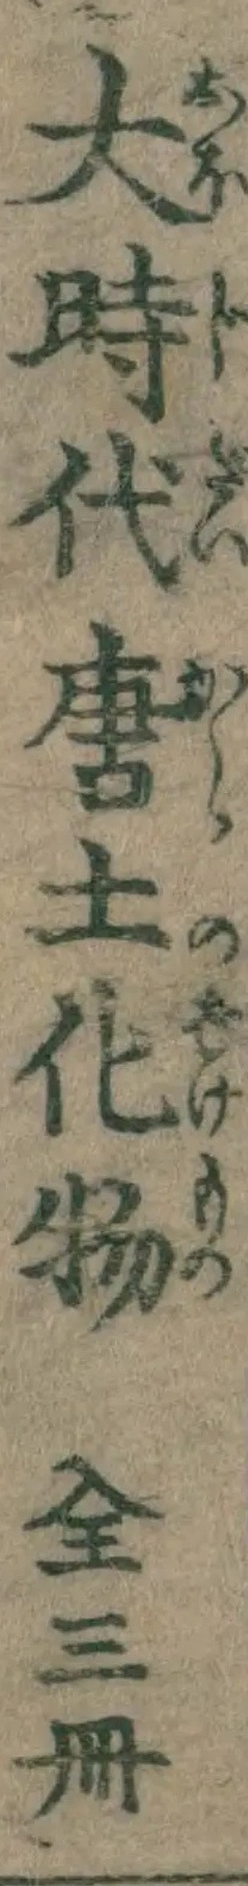大時代唐土化物全三冊
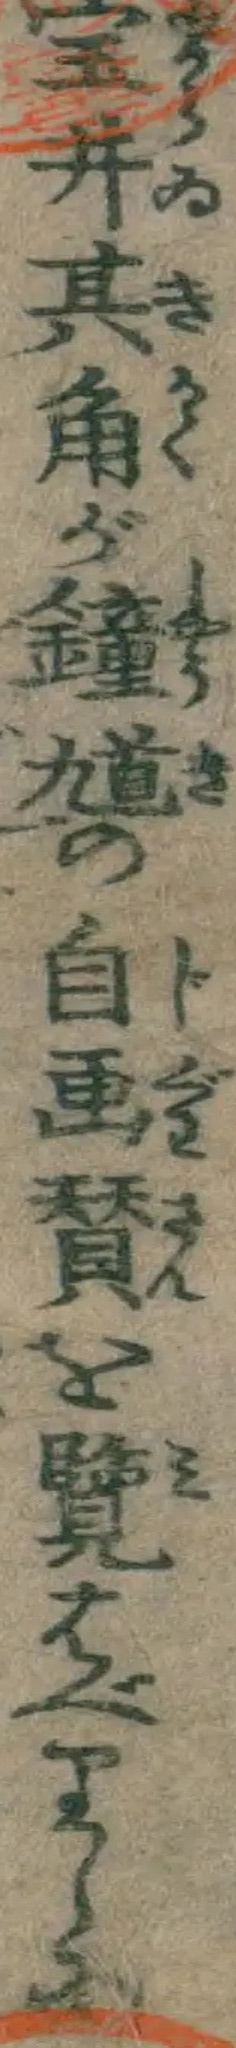宝井其角が鍾馗の自画賛を覧はべりしに
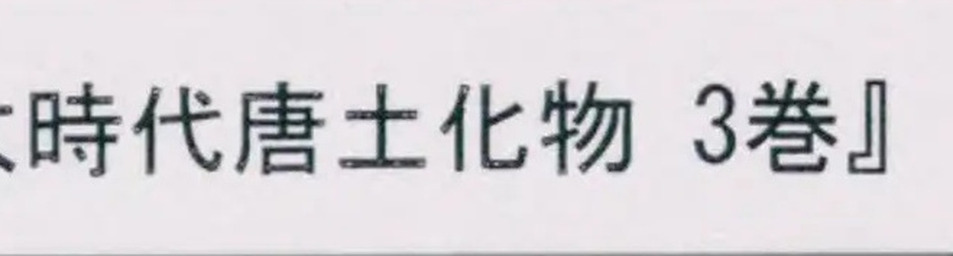大時代唐土化物全三冊
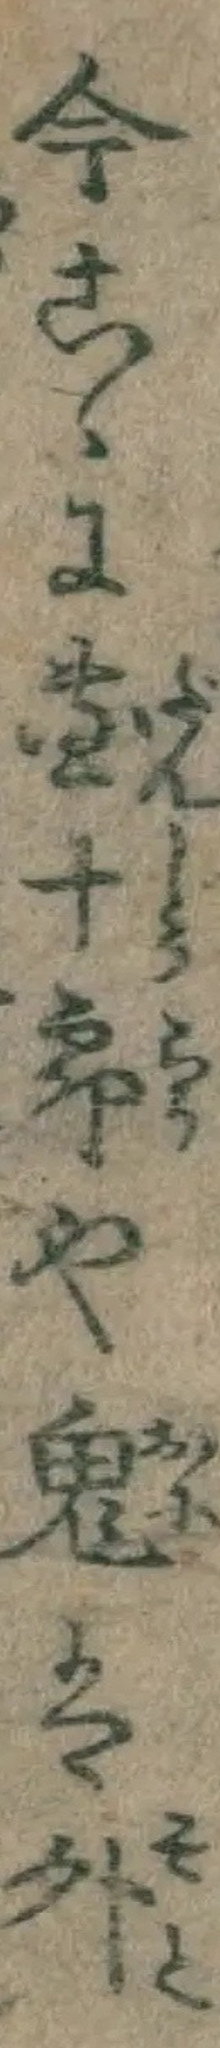今こゝに団十郎や鬼は外
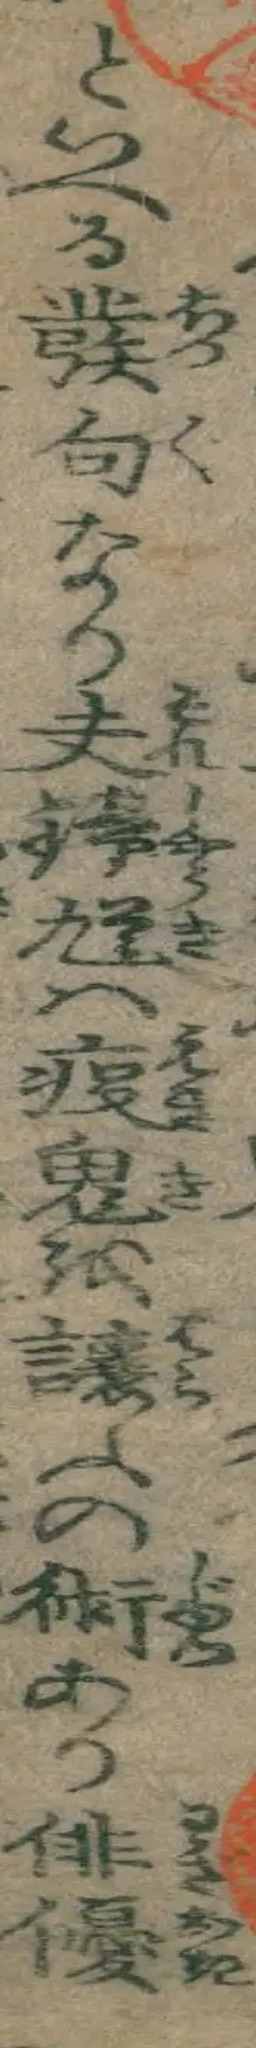といへる発句なり夫鍾馗は疫鬼を譲ふの術あり俳優
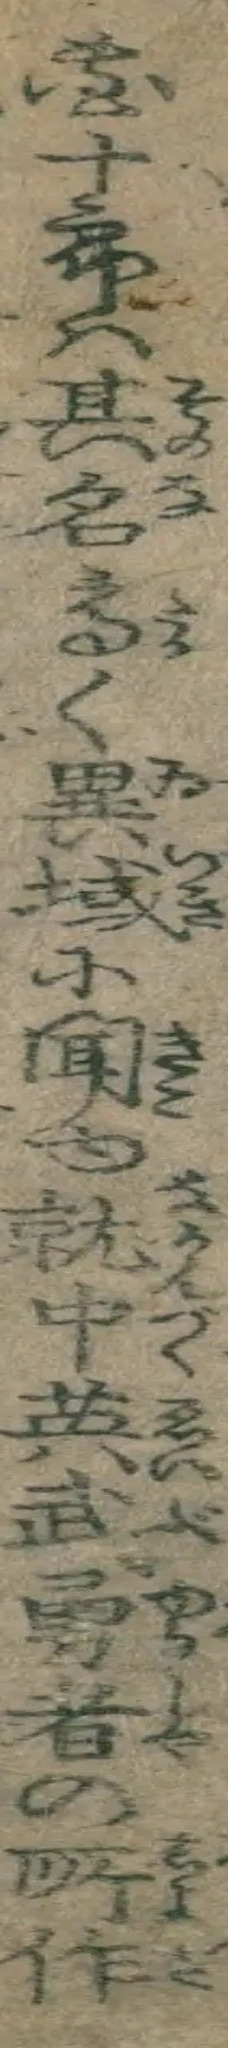団十郎は其名高く異域に聞ゆ就中英武勇者の所作
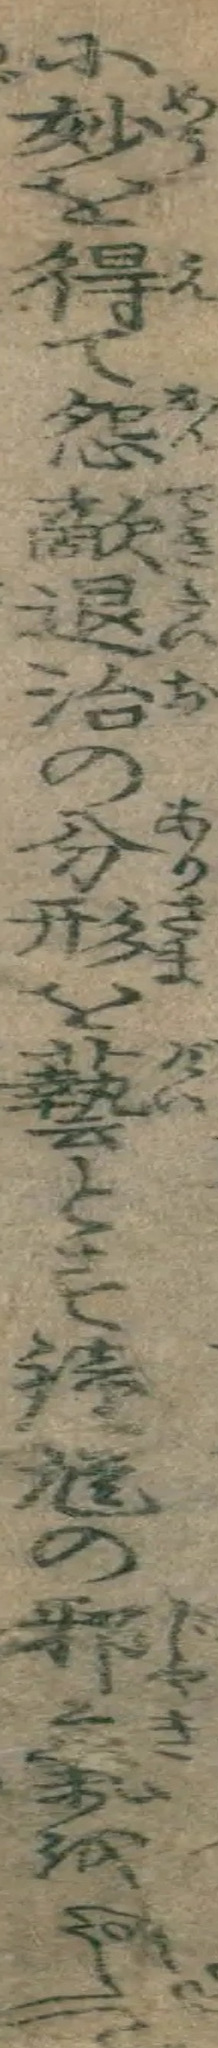に妙を得て怨敵退治の分形を藝とす鍾馗の邪気を
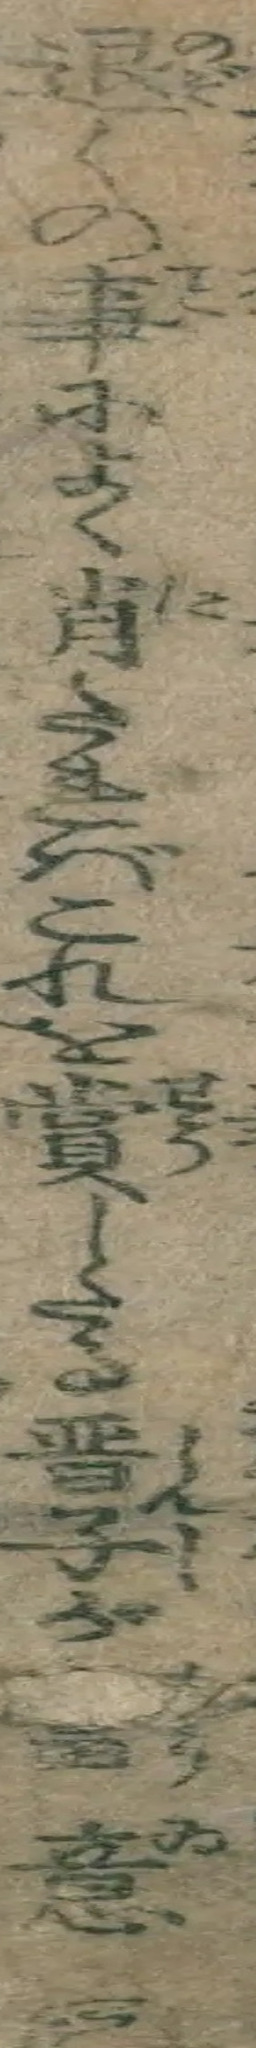退くの事によく肖たればこれを賞したる晋子が当意
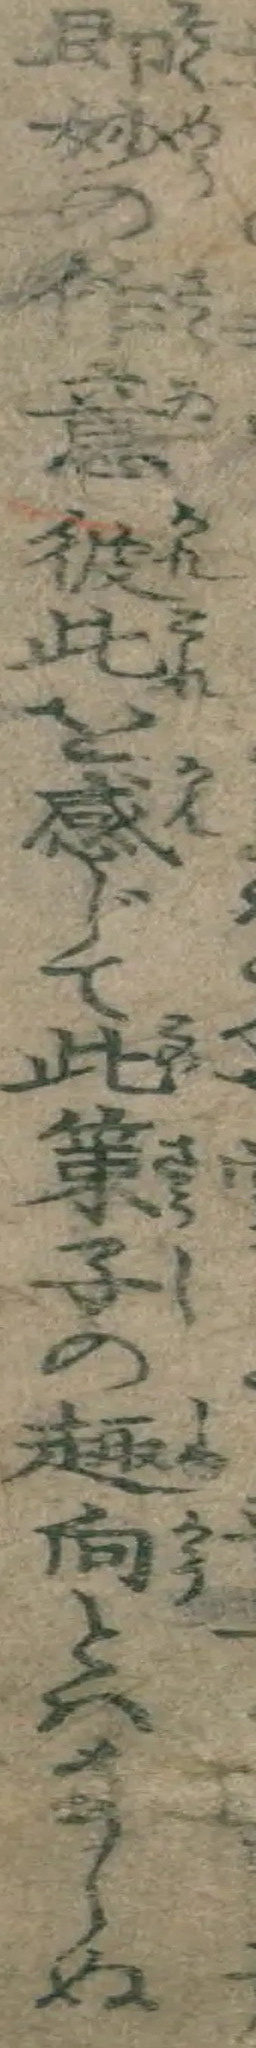即妙の作意彼此を感じて此策子の趣向とはなしぬ
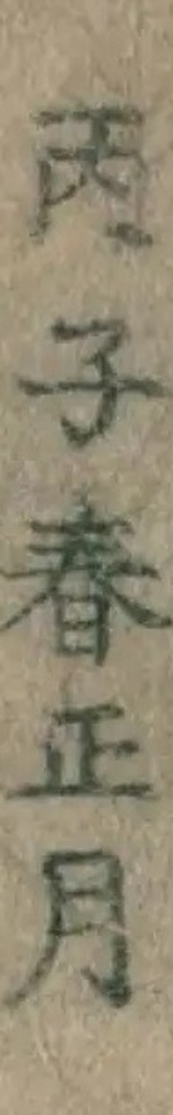丙子春正月

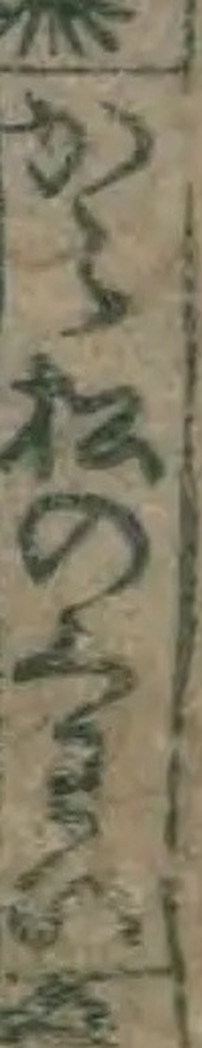から松のくわい
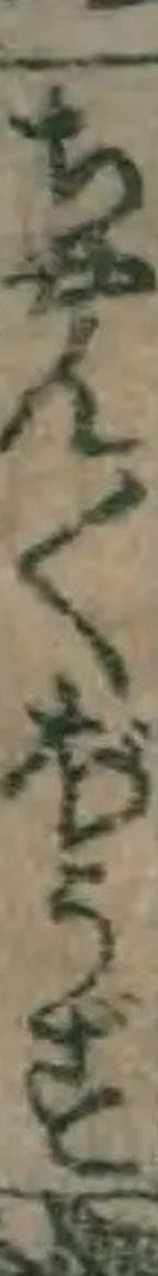ちやん〳〵ぼうず
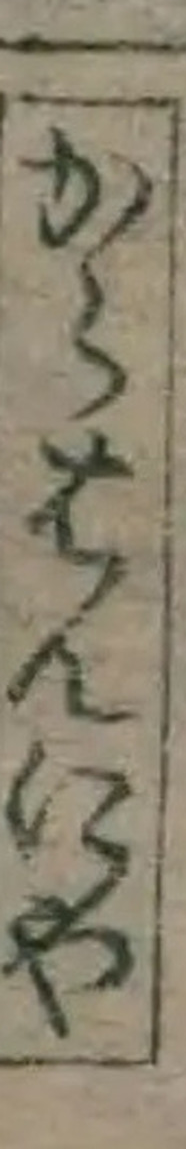からはんにや
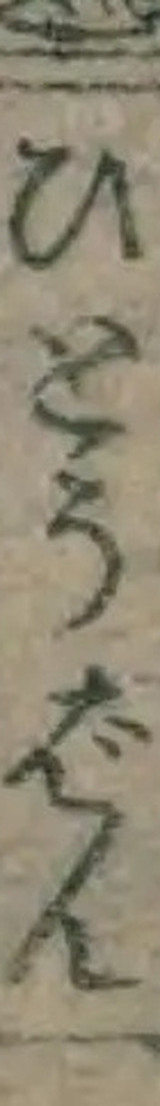ひとうばん
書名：大時代唐土化物 3巻
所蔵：国立国会図書館 National Diet Library, JAPAN
